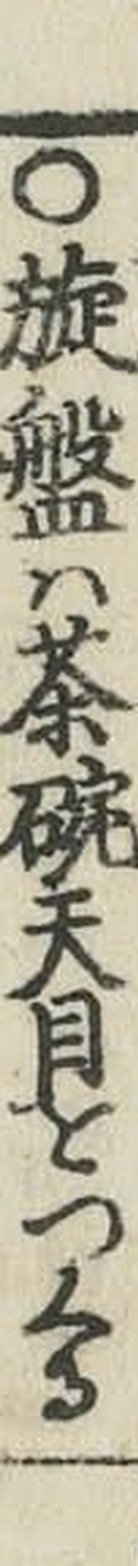○旋盤は茶碗天目をつくる
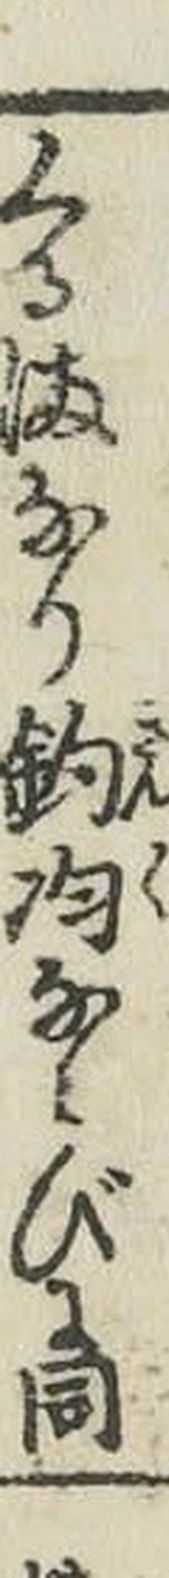くるまなり釣ならびに同
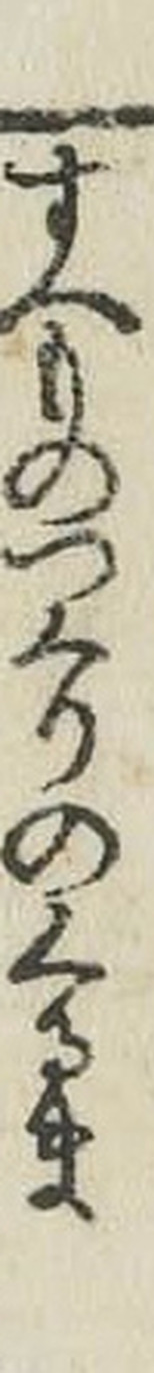すへものつくりのくるま
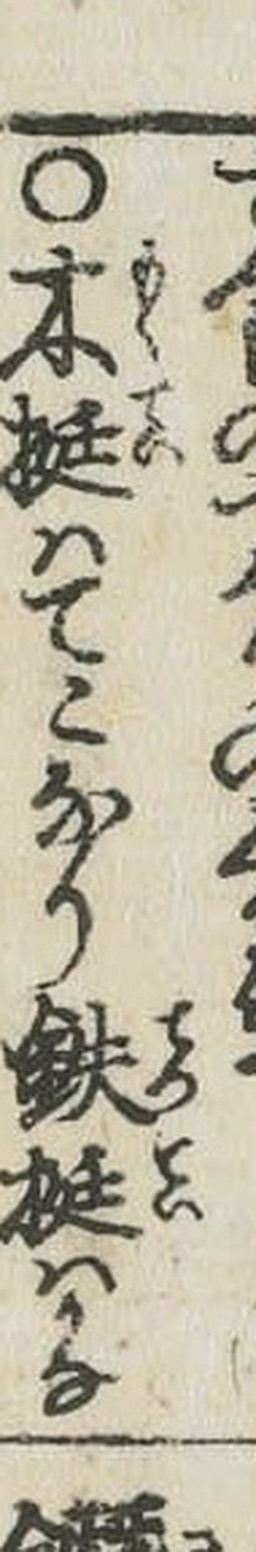○木梃はてこなり鉄梃はかな
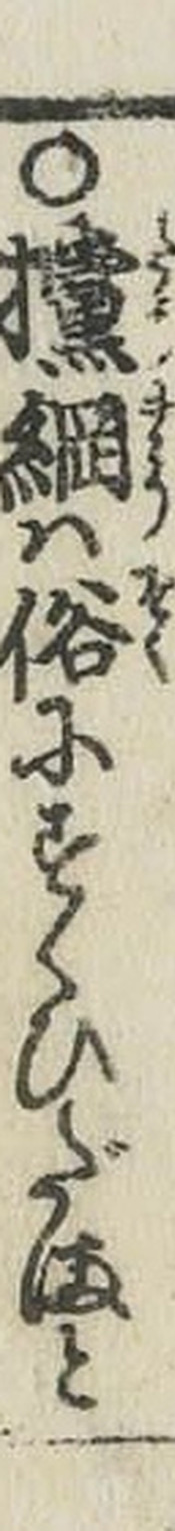○攩網は俗にすくひだまと
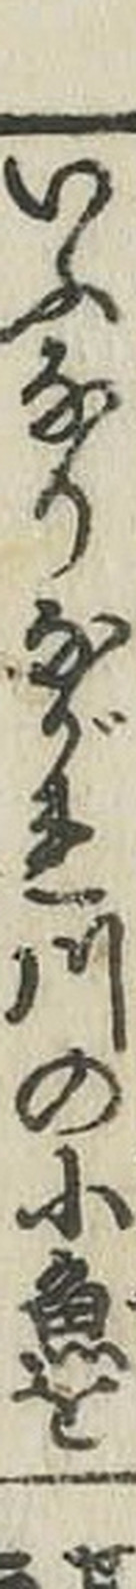いふなりながれ川の小魚を
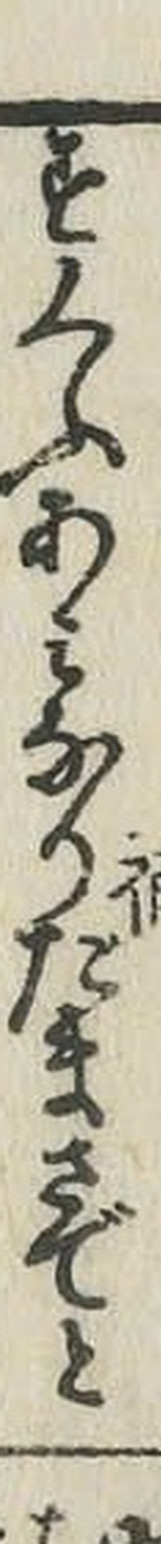すくふあみなりたまさでと
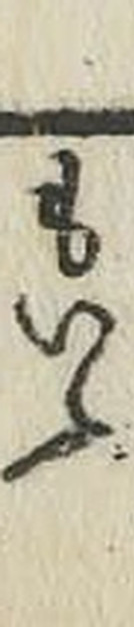もいふ
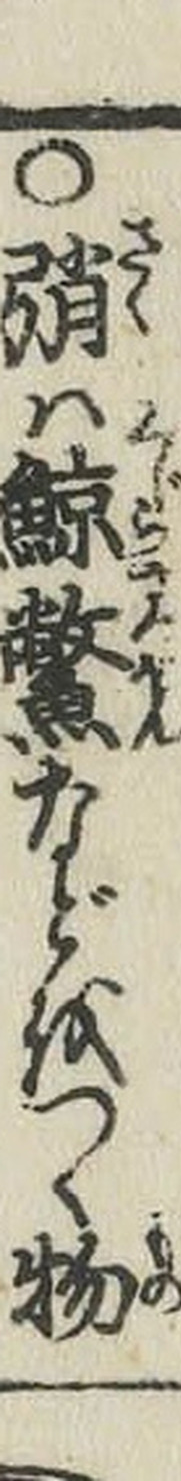○弰は鯨鱉などをつく物
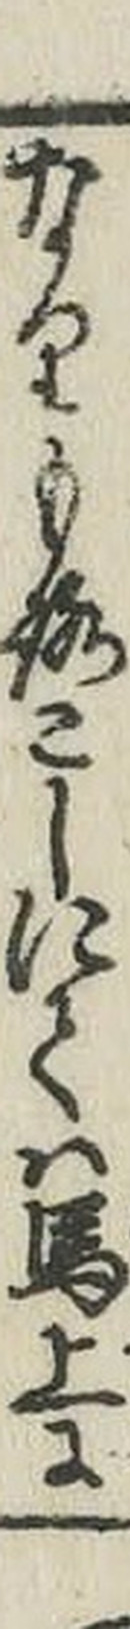なりもろこしにては馬上に
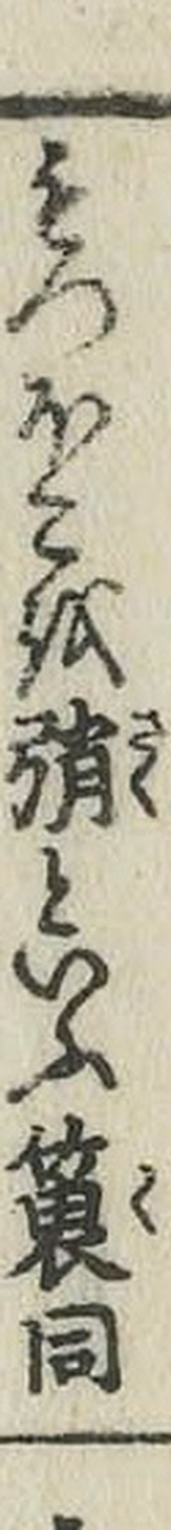もつほこを弰といふ𥯜同
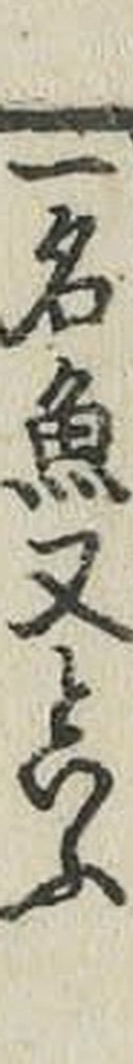一名魚叉という
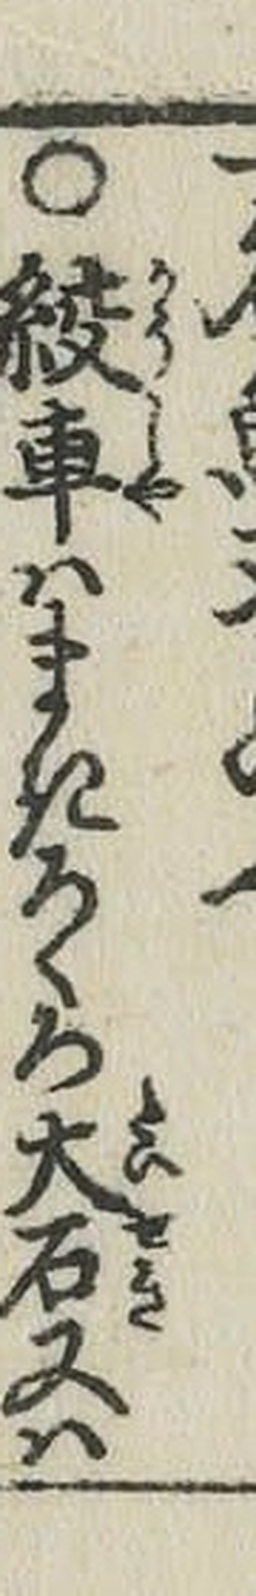○絞車はまきろくろ大石又は

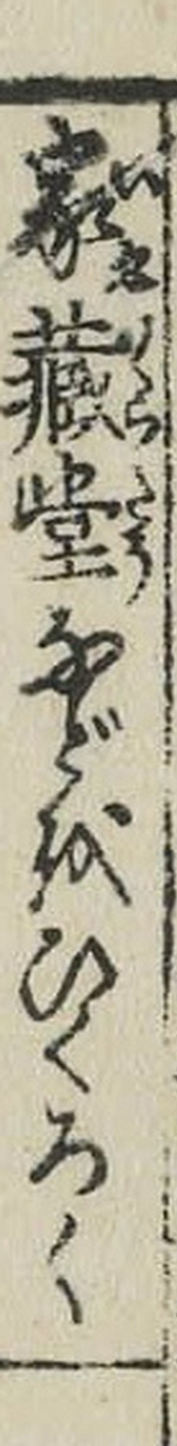家蔵堂などをひくろく
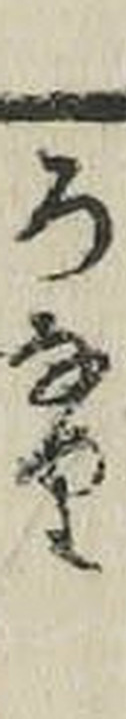ろなり
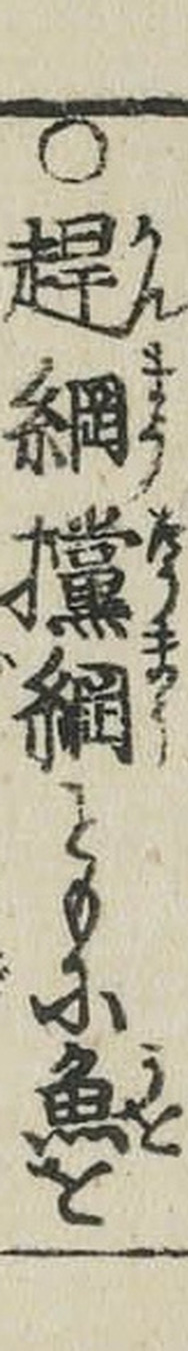○趕網攩網ともに魚を
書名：増補頭書訓蒙図彙大成 10巻 5:巻之9-11
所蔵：東京学芸大学教育コンテンツアーカイブ
